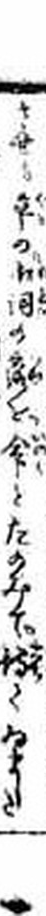させもの御詞の露を命とたのみて待てゐました基
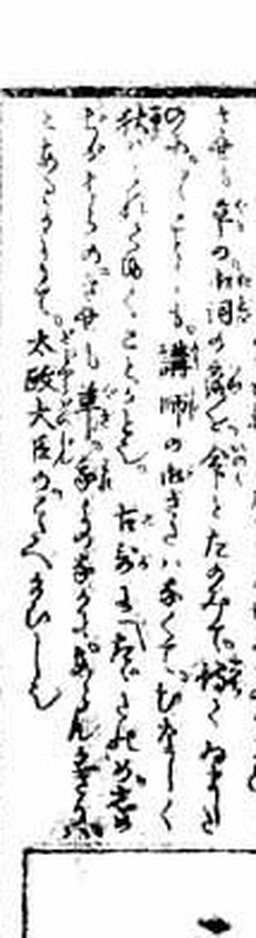秋はられてゆくことかと也右哥にたゞたのめ俊
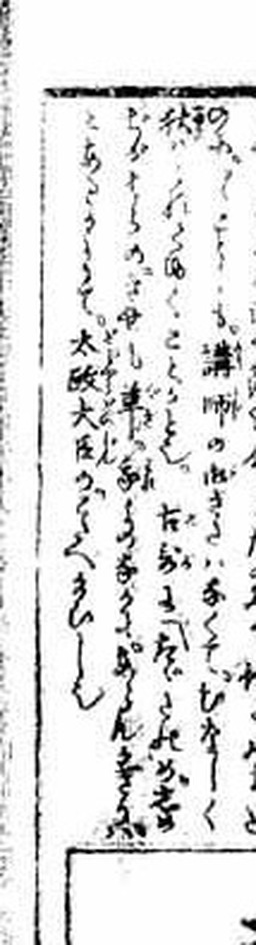ぢがはらのさせも我よのなかにあらんかぎりは
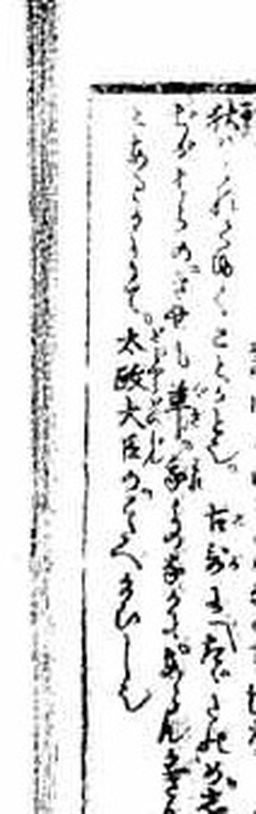とあるよりて太政大臣のこたへ給ひし也

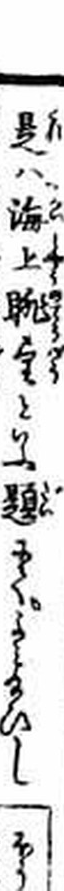是は海上眺望といふ題にてよみ給ひし
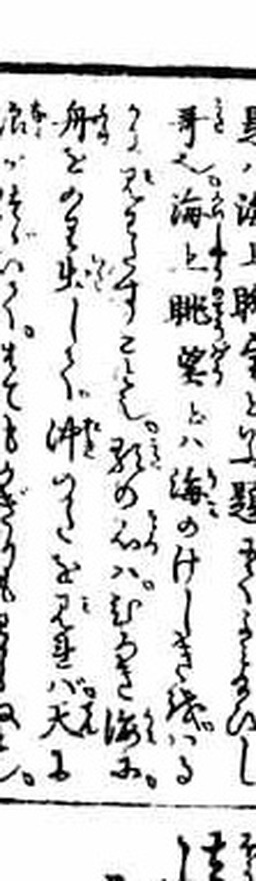かに見わたすこと也歌の心はひろき海に前関白
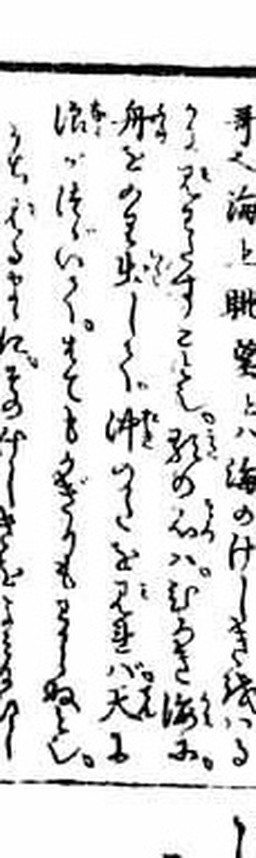舟をのり出して沖のかたを見れば天に
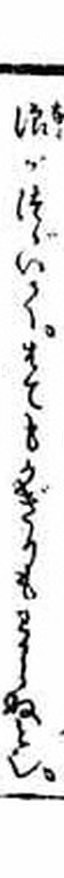浪がつゞいてはてもかぎりもわかぬと也
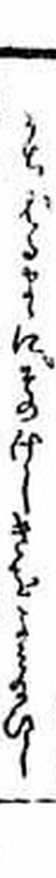うちはるまゝにそのけしきをよみ給ひし
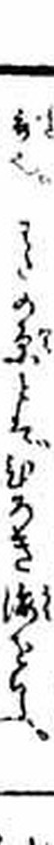哥也わたの原とはひろき海をいふ太
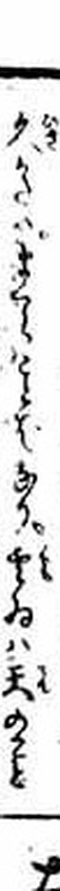久かたはまくらことばなり雲ゐは天のこと政
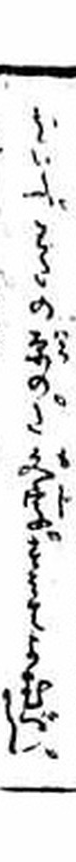をいふわたの原のた文字すきてよみべし大
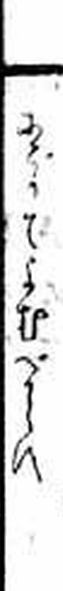のごりてよみべからず臣
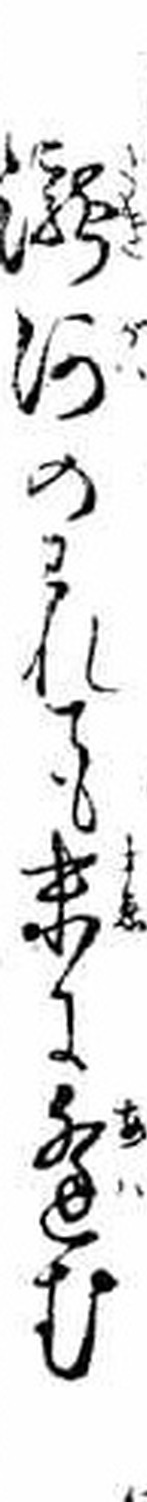瀧河のわれても末に逢む
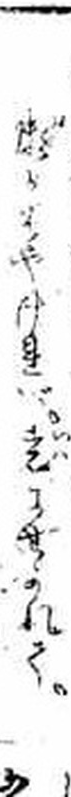瀬がはやければ岩にせかれて崇
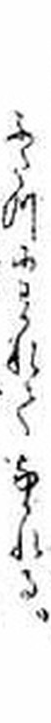ふた河にわかれてせかれる
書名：小倉百人一首
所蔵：東京学芸大学教育コンテンツアーカイブ
